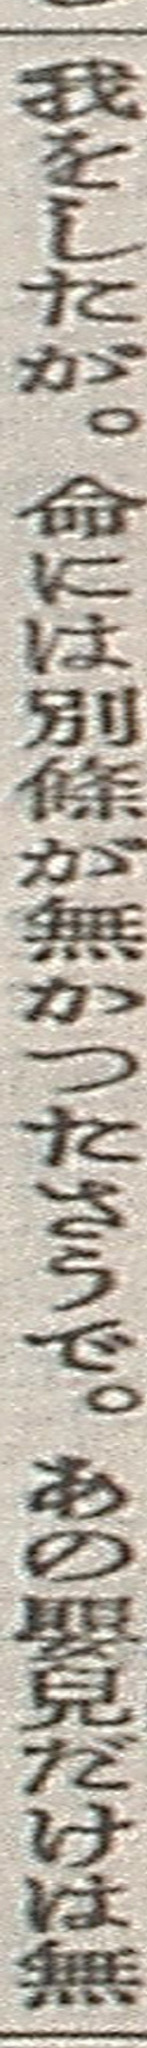我をしたが。命には別条が無かつたさうで。あの嬰児だけは無
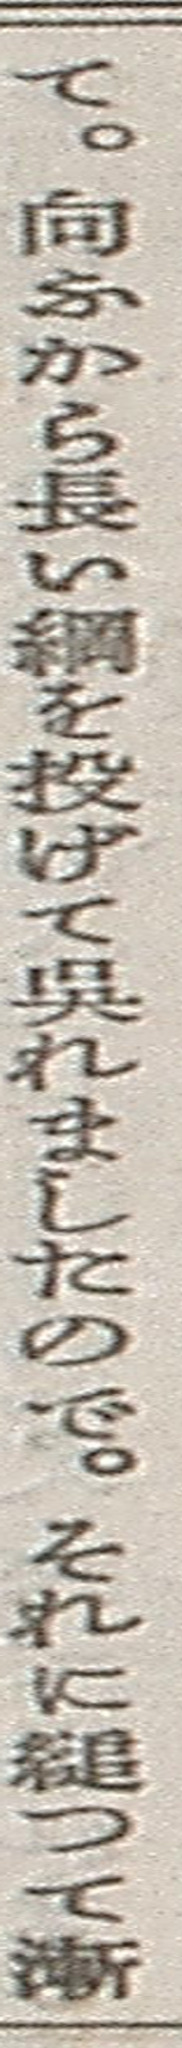て。向ふから長い綱を投げて呉れましたので。それに縋つて漸
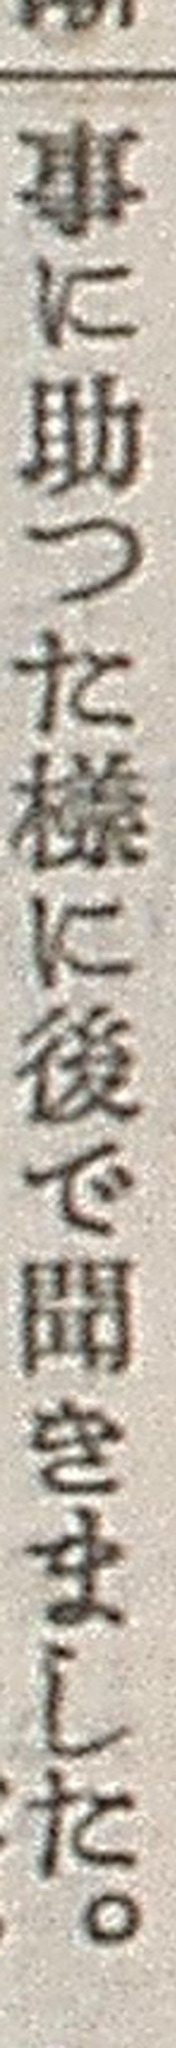事に助つた様に後で聞きました。
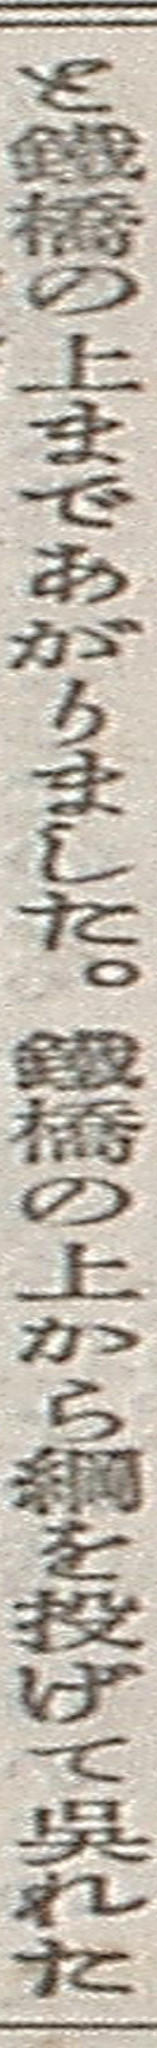と鉄橋の上まであがりました。鉄橋の上から綱を投げて呉れた
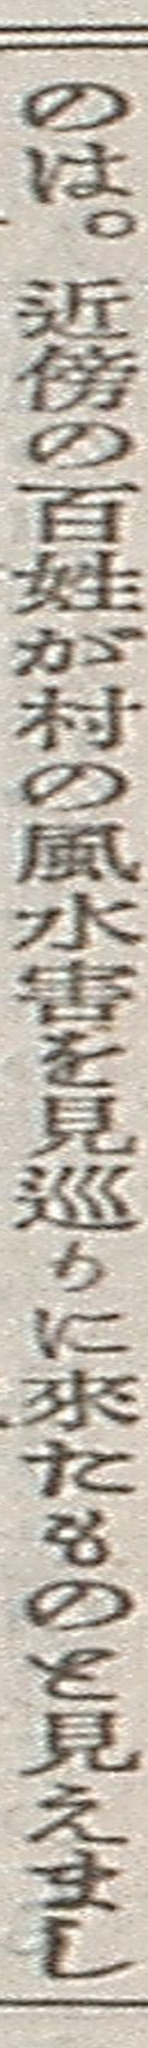のは。近傍の百姓が村の風水害を見巡りに来たものと見えまし
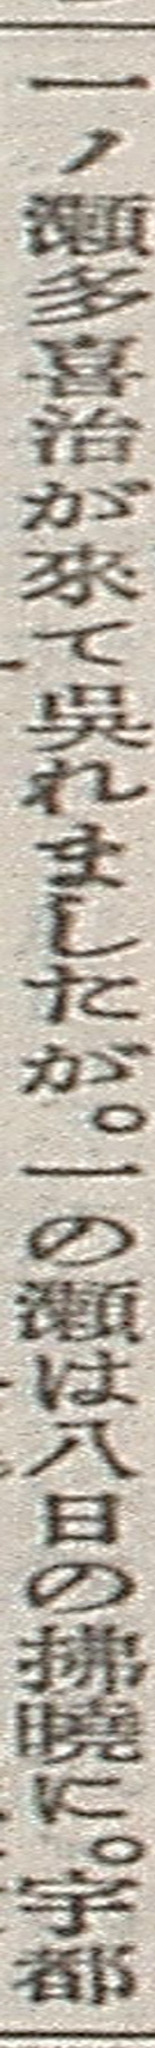一ノ瀬多喜治が来て呉れましたが。一の瀬は八日の払暁に。宇都
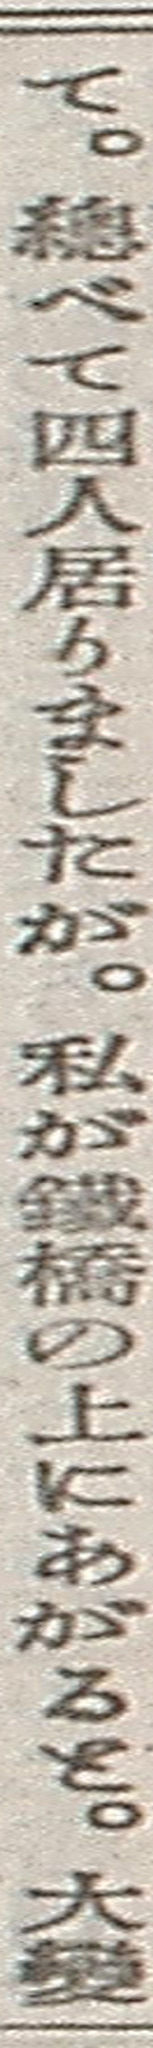て。総べて四人居りましたが。私が鉄橋の上にあがると。大変
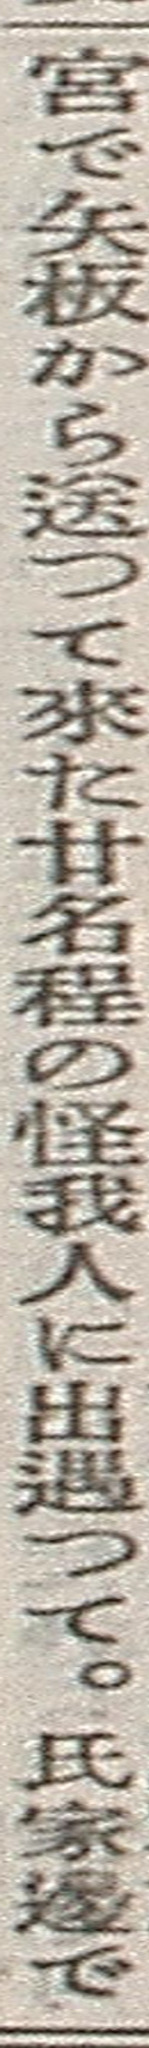宮で矢板から送つて来た廿名程の怪我人に出遇つて。氏家辺で

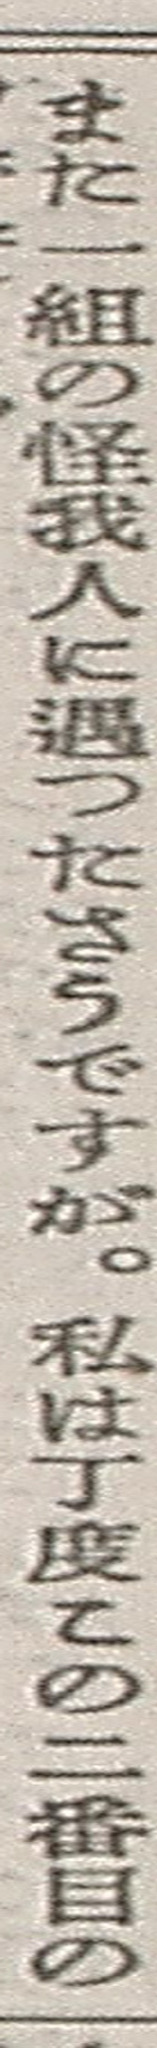また一組の怪我人に遇つたさうですが。私は丁度この二番目の
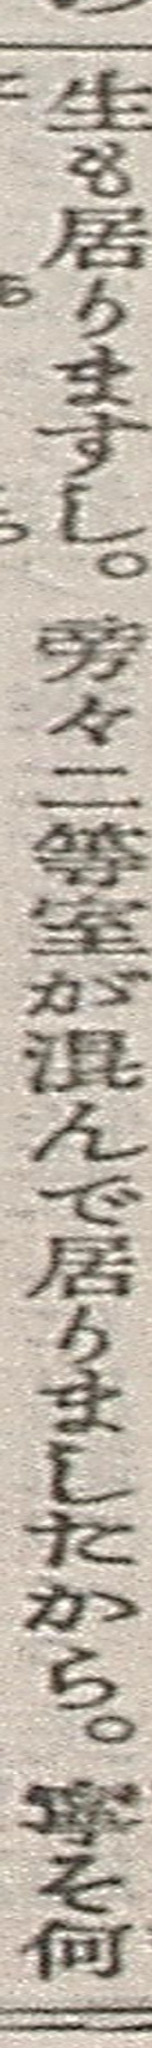生も居りますし。旁々二等室が混んで居りましたから。寧そ何
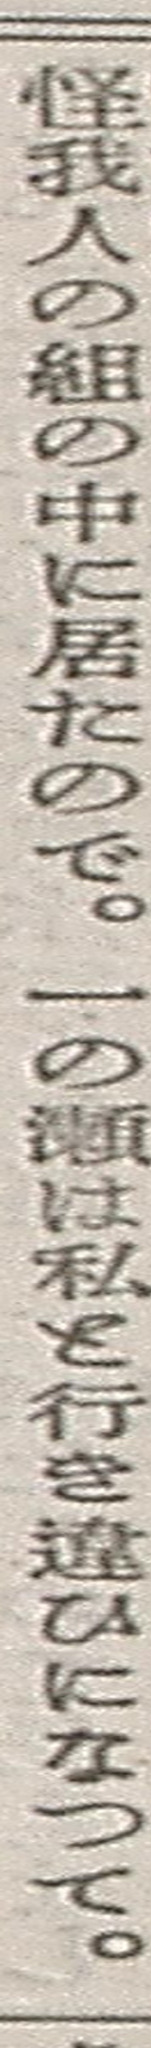怪我人の組の中に居たので。一の瀬は私と行き違ひになって。
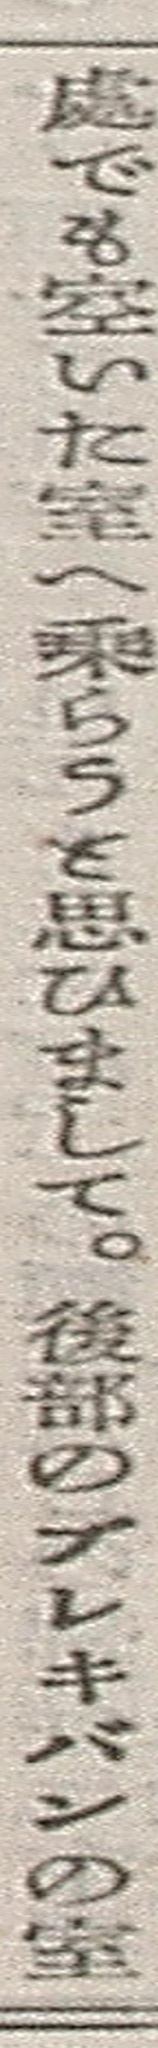処でも空いた室へ乗らうと思ひまして。後部のブレキバンの室
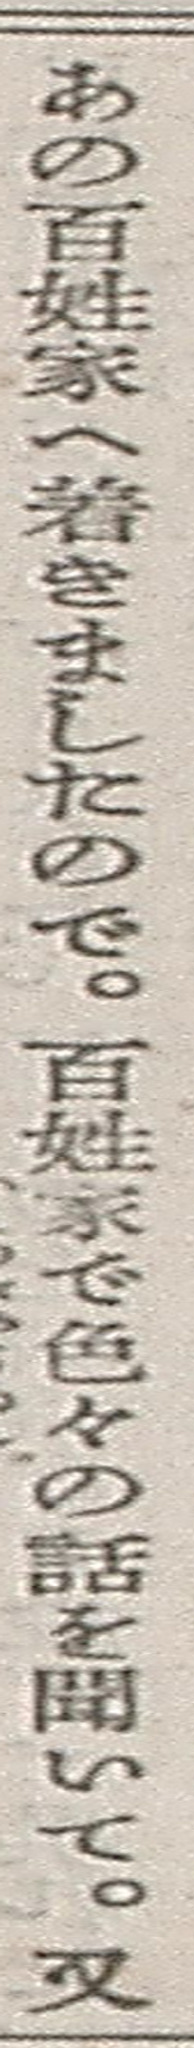あの百姓家へ着きましたので。百姓家で色々の話を聞いて。又
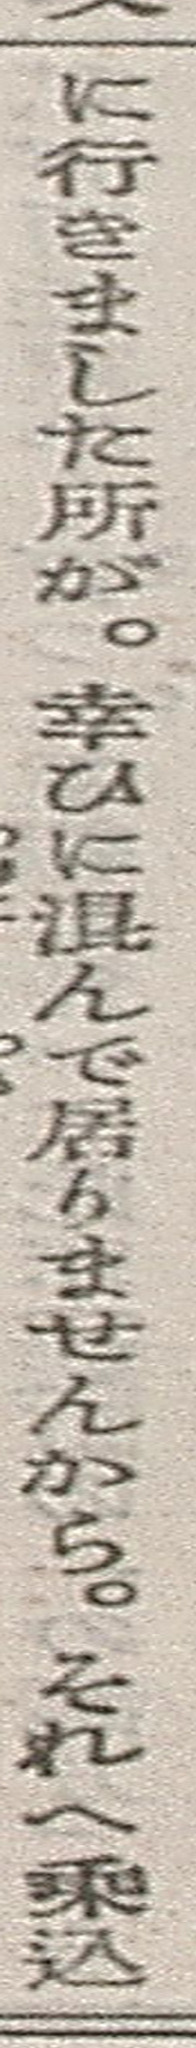に行きました所が。幸ひに混んで居りませんから。それへ乗込
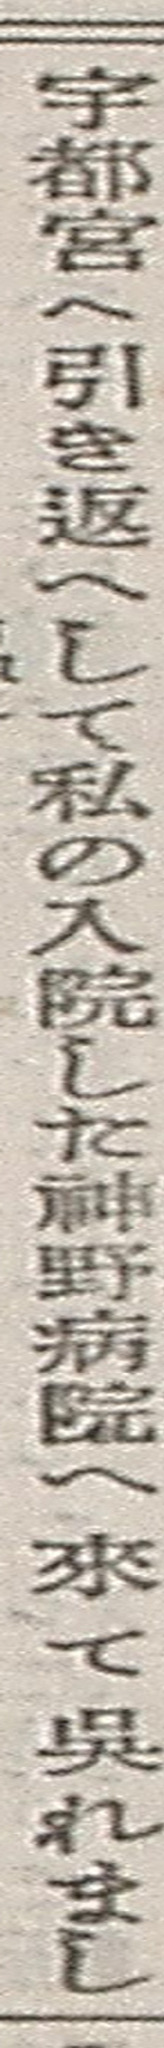宇都宮へ引き返へして私の入院した神野病院へ来て呉れまし
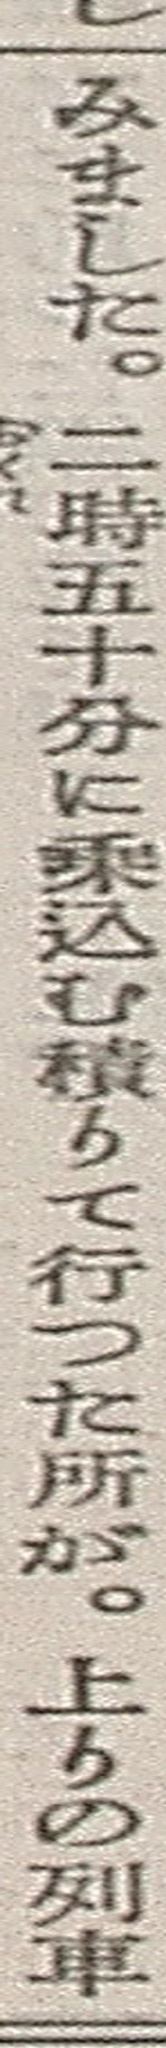みました。二時五十分に乗込む積りて行つた所が。上りの列車
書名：風俗畫報臨時増刊第百九十九號　明治三十二年十月各地災害圖會（前編之續）
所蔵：東京大学地震研究所図書室 Earthquake Research Institute Library, The University of Tokyo, JAPAN
